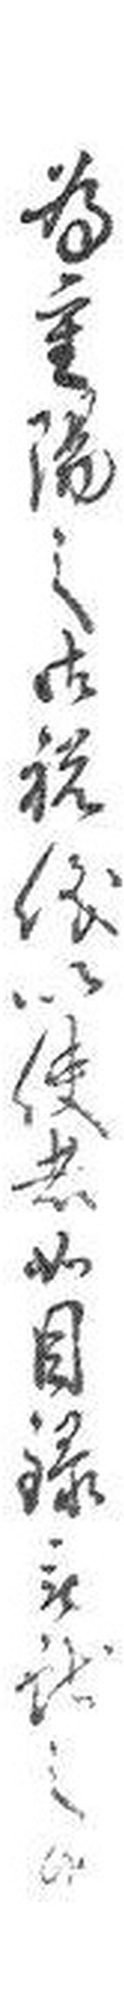為重陽御祝儀以御使者如目録被献之候
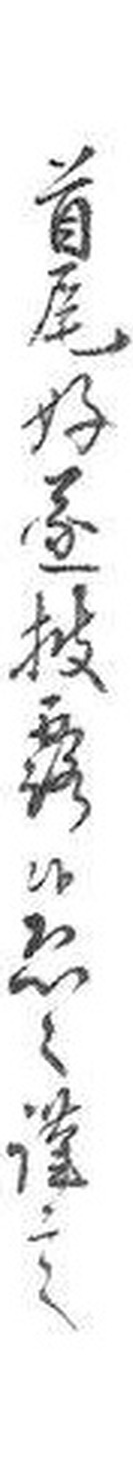首尾好遂披露候恐々謹言
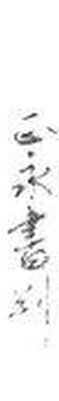正永書判
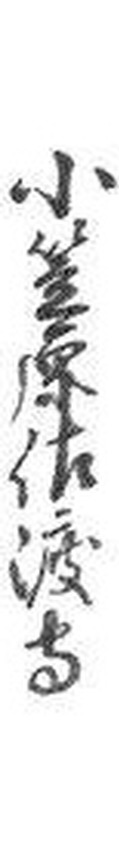小笠原佐渡守
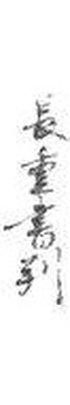長重書判
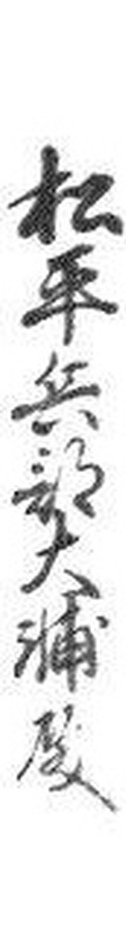松平兵部大輔殿
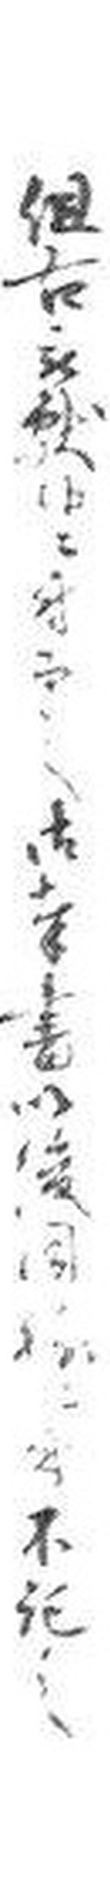但右被献候ニ付而之御奉書以後同様ニ而不記之
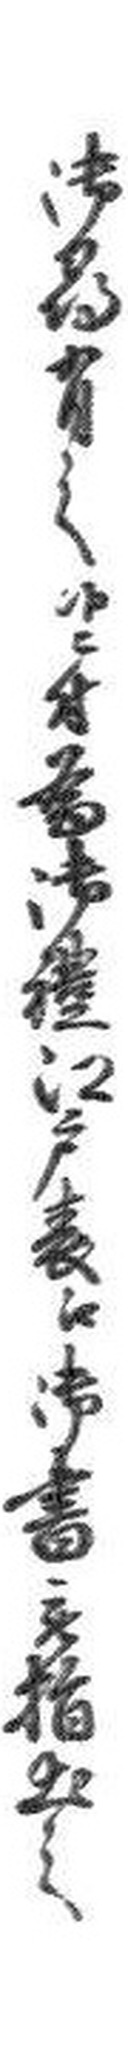御尋有之候ニ付為御礼江戸表江御書被指出之
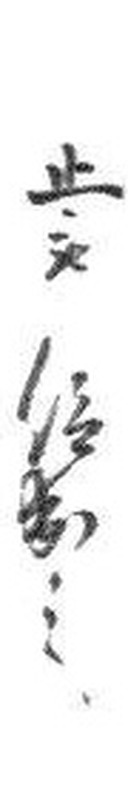止被仰出之
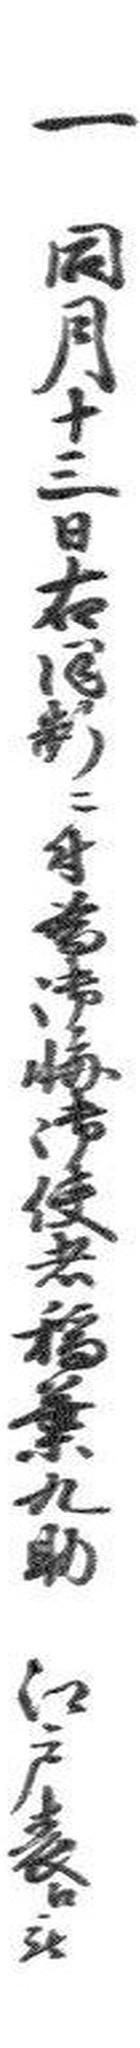一同月十三日右同断ニ付為御悔御使者稲葉九助江戸表江被
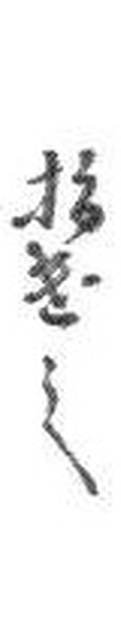指遣之
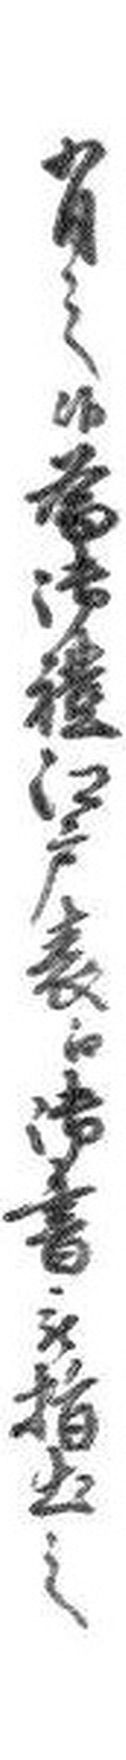有之候為御礼江戸表江御書被指出之

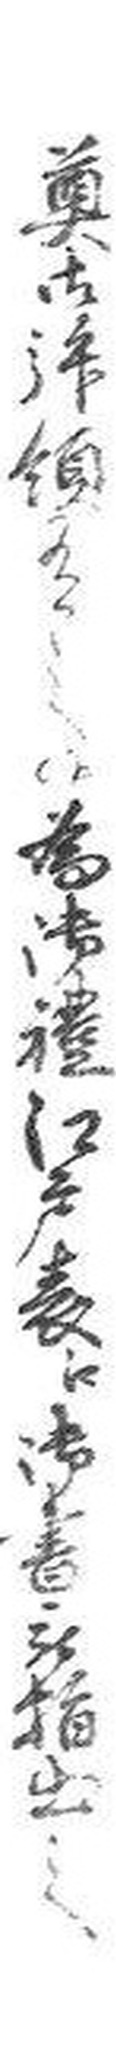奠御拝領有之候為御礼江戸表江御書被指出之
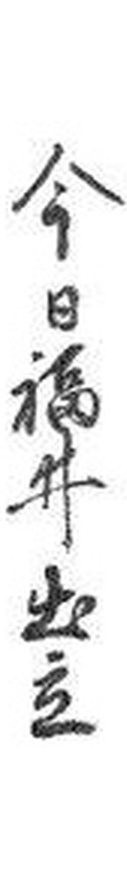今日福井出立
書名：家譜 二十三 吉品公 従宝永元年到同二年
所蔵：福井県文書館 Fukui Prefectural Archives
